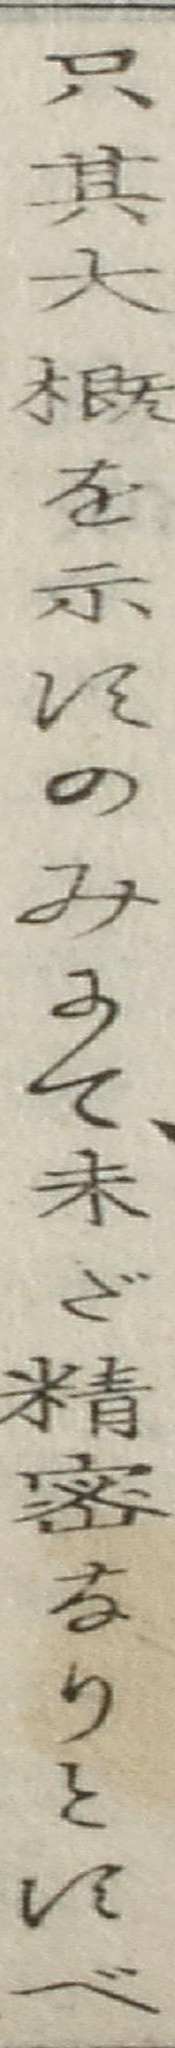只其大概を示すのみにて、未だ精密なりとすべ
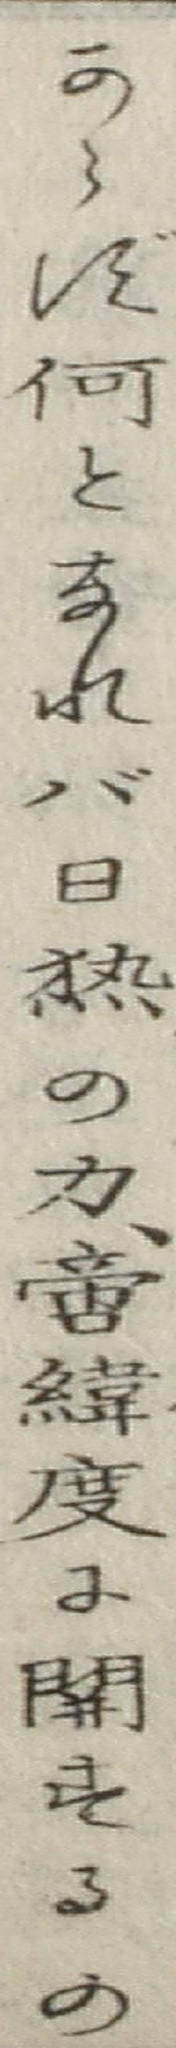からず、何となれば日熱の力、啻緯度に関するの
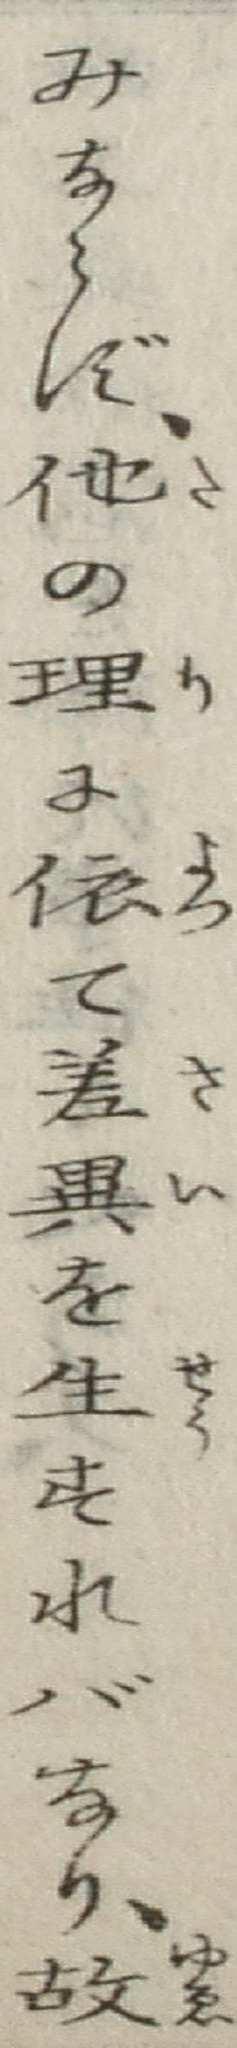みならず、他の理に依て差異を生すればなり、故
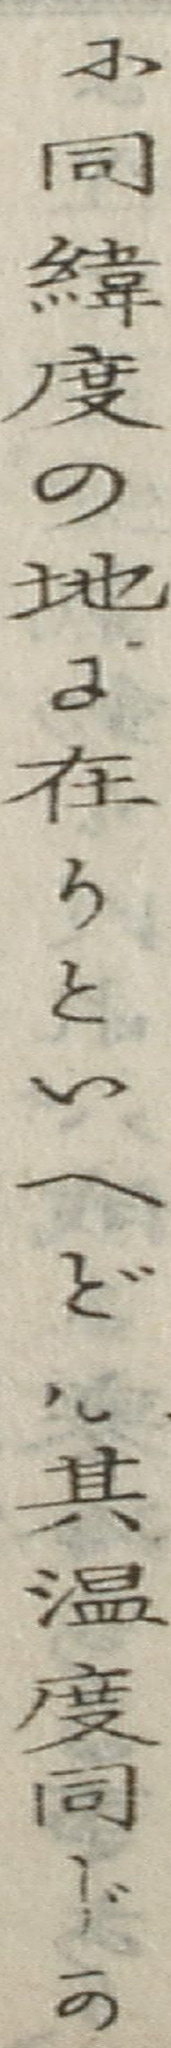に同緯度の地に在りといへども、其温度同じか
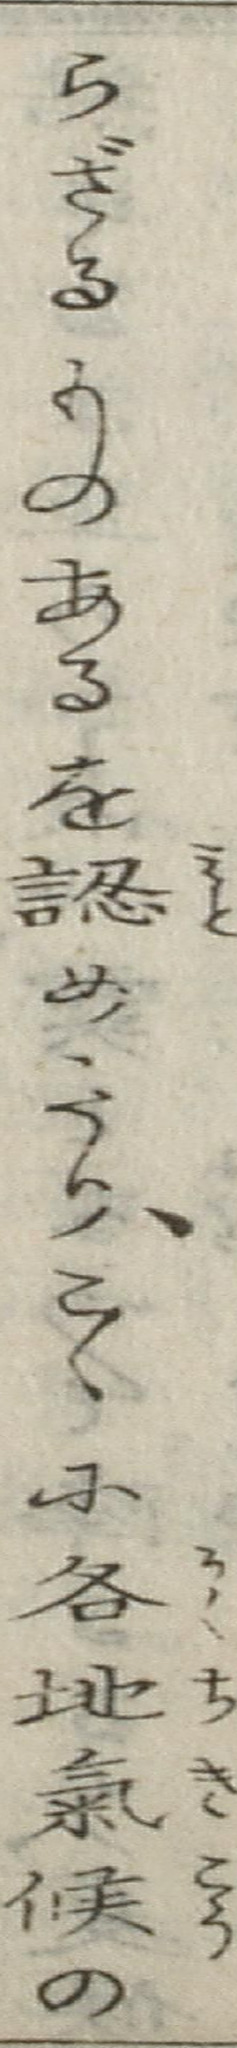らざるものあるを認めたり、こゝに各地気候の
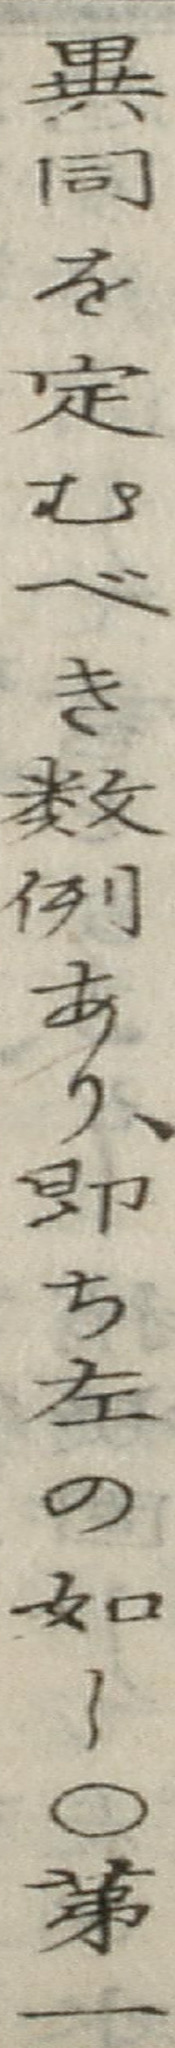異同を定むべき数例あり、即ち左の如し○第一
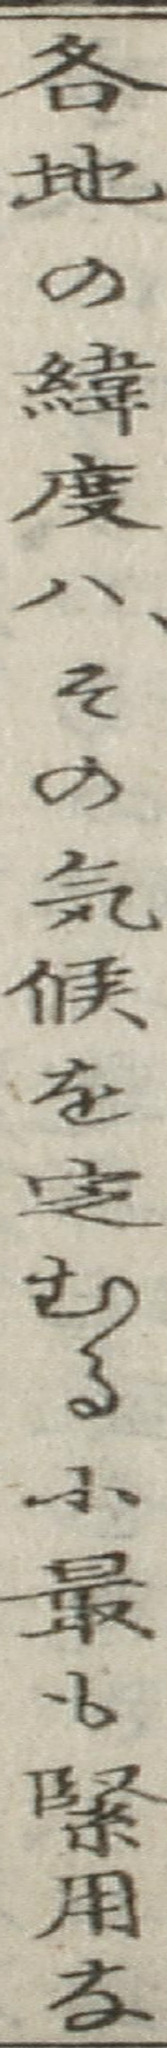各地の緯度は、その気候を定むるに最も緊用な
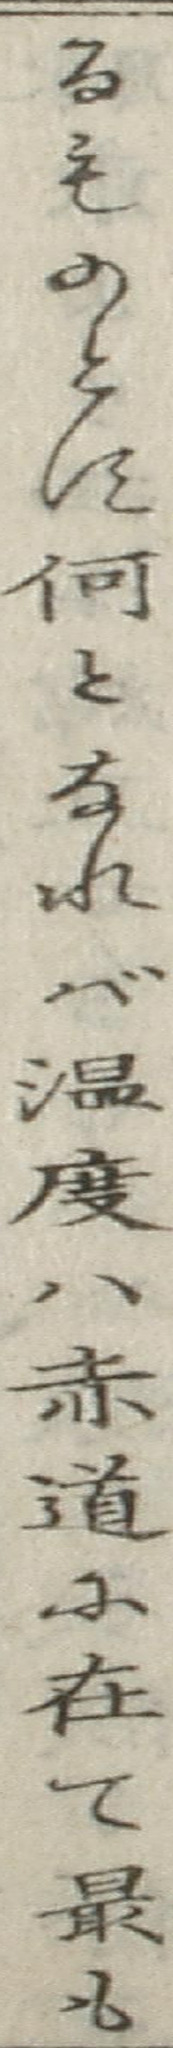るものとす、何となれば温度は赤道に在て最も
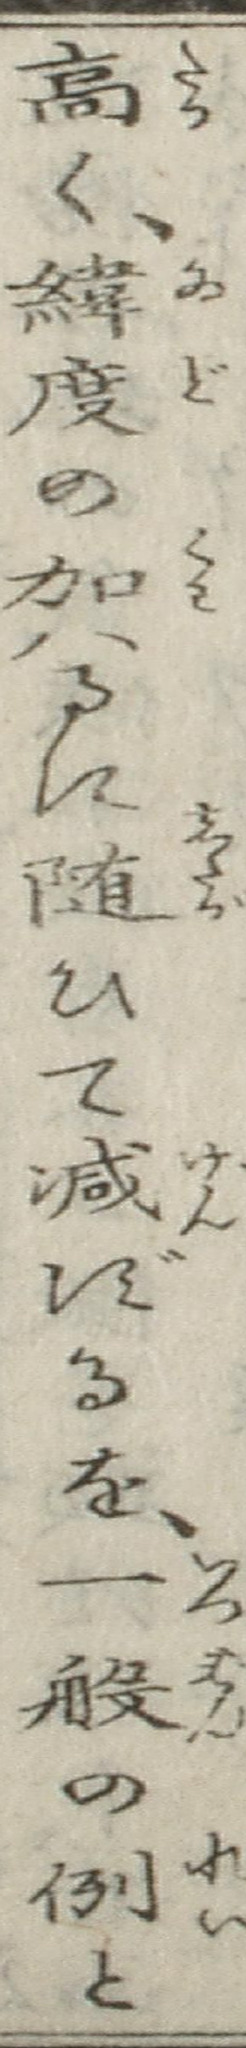高く、緯度の加はるに随ひて減ずるを、一般の例と
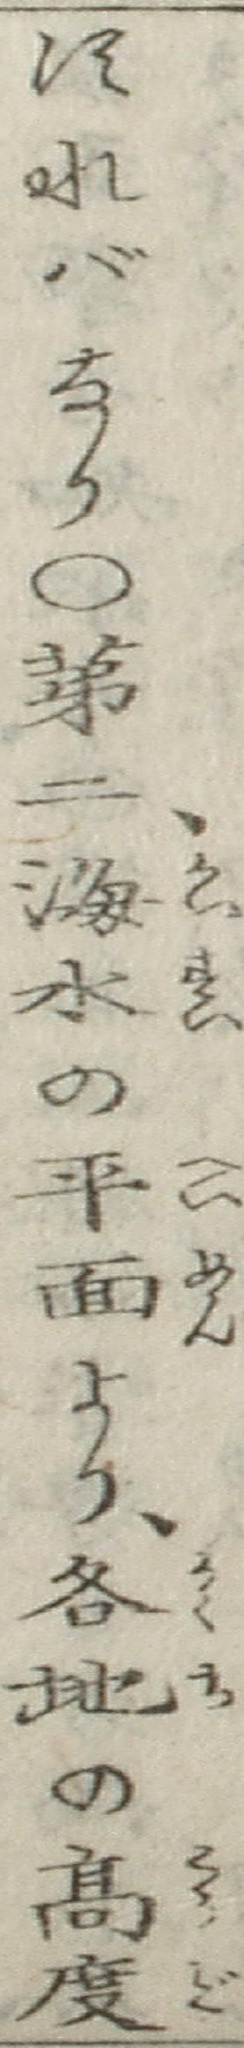すればなり○第二、海水の平面より、各地の高度
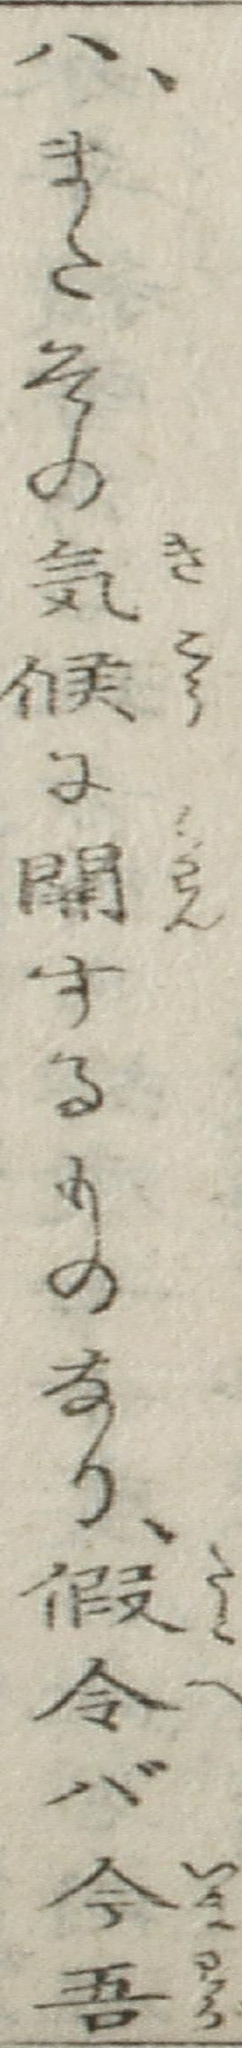は、またその気候に関するものなり、仮令ば今吾
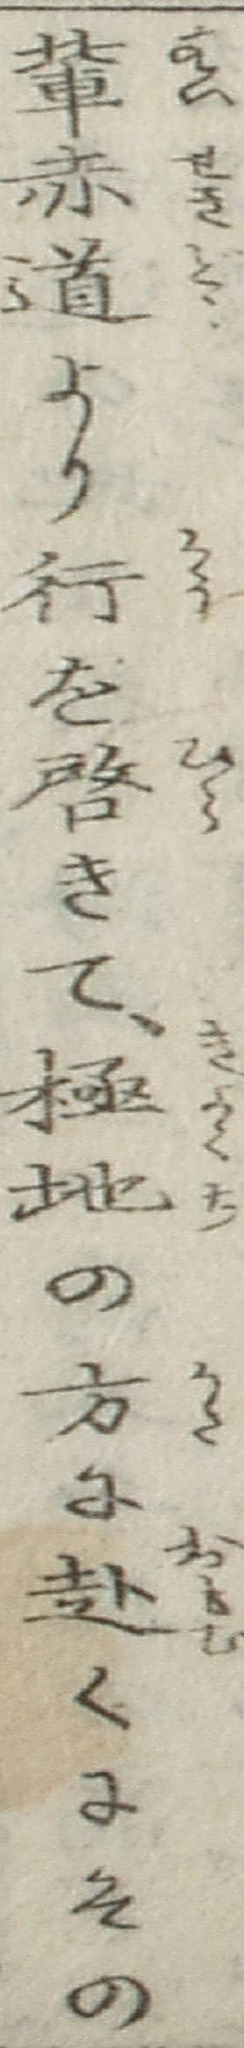輩赤道より行を啓きて、極地の方へ赴くにその
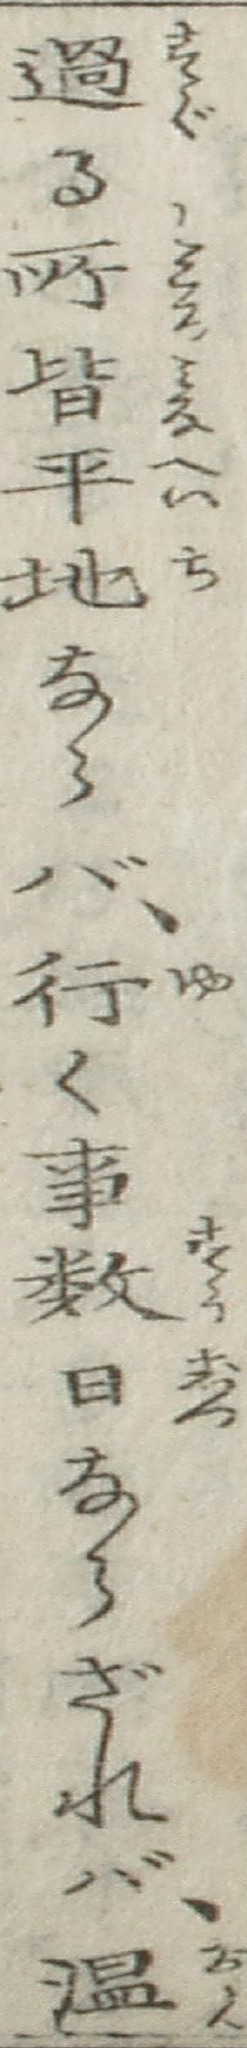過る所皆平地ならば、行く事数日ならざれば、温
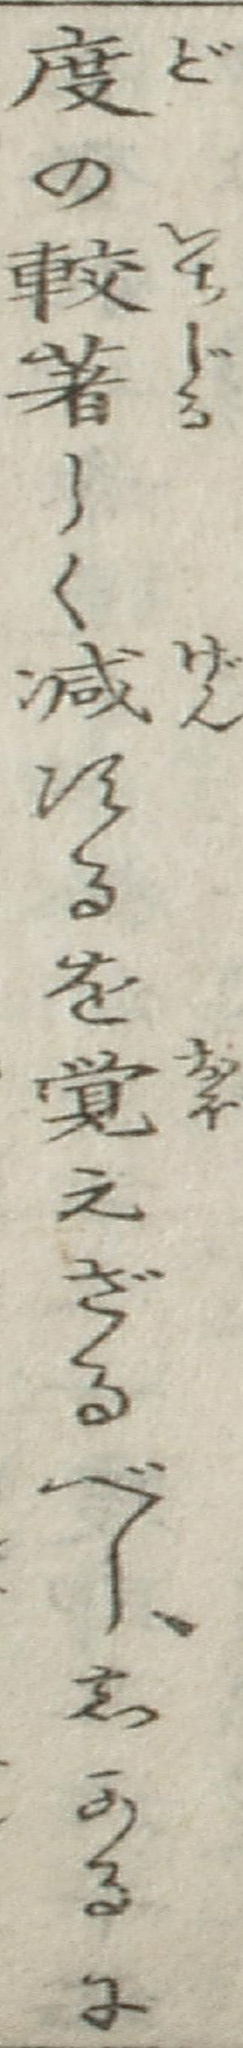度の較著しく減するを覚えざるべし、しかるに
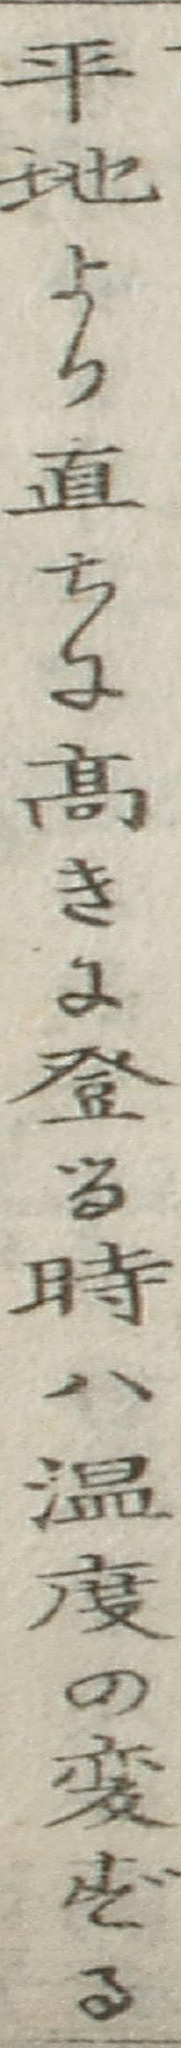平地より直ちに髙きに登る時は、温度の変ずる

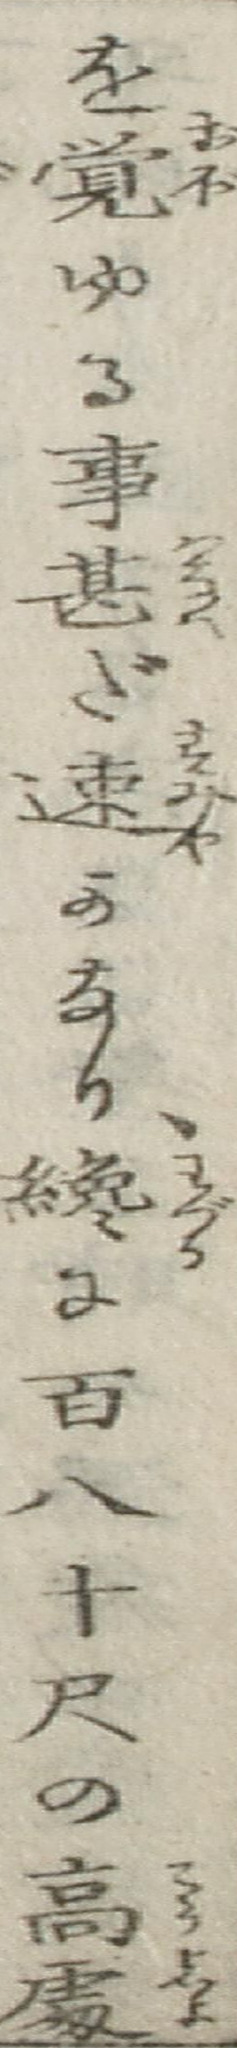を覚ゆる事甚だ速かなり、僅に百八十尺の高処
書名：訓蒙　天然地理學　下
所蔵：東京大学地震研究所図書室 Earthquake Research Institute Library, The University of Tokyo, JAPAN
